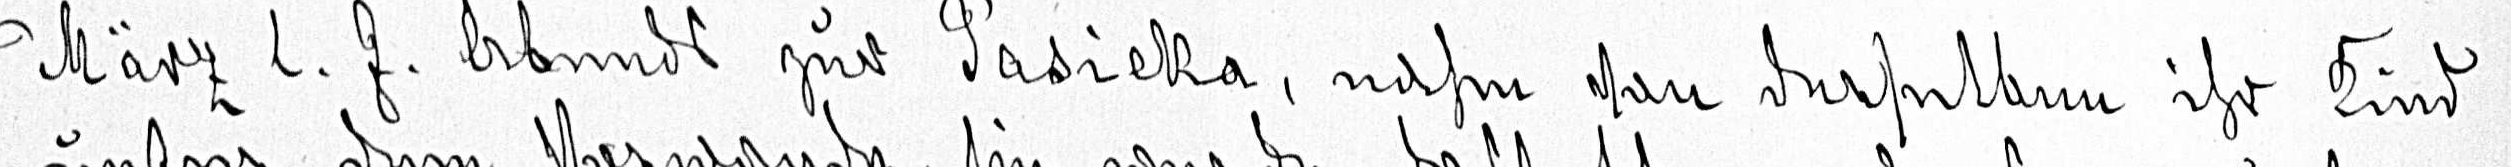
März l. J. Abends zur Pasieka, nahm von derselben ihr Kind
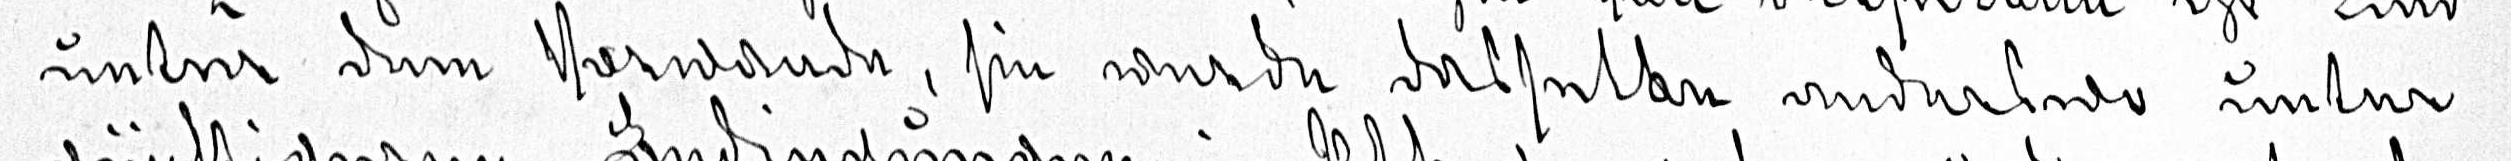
unter dem Vorwande, sie wurde desselben anderswo unter
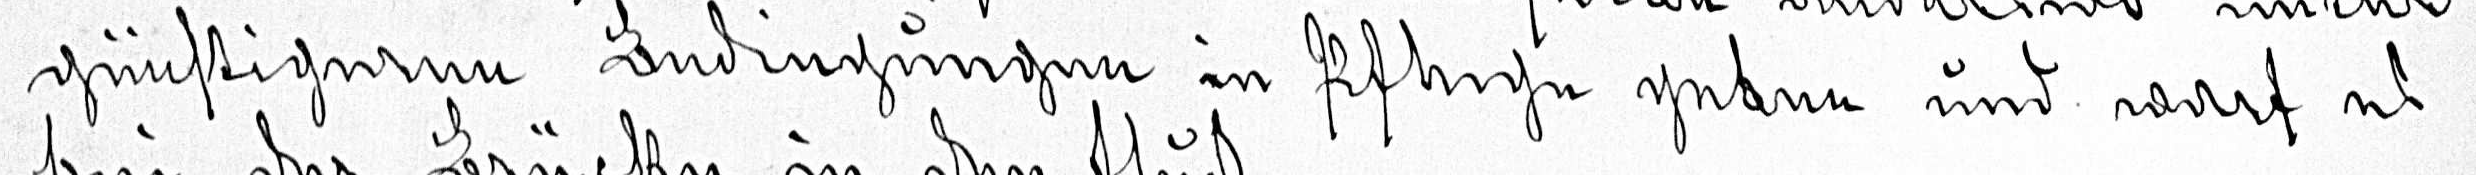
günstigeren Bedingungen in Pflege geben und warf es
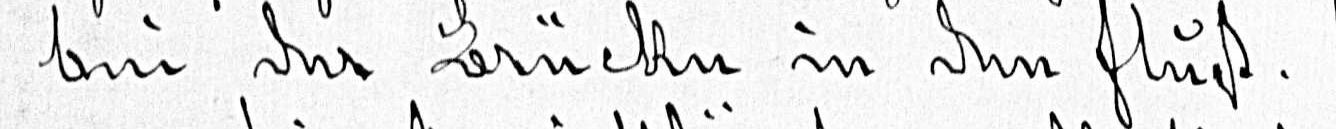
bei der Brücke in den Fluß.
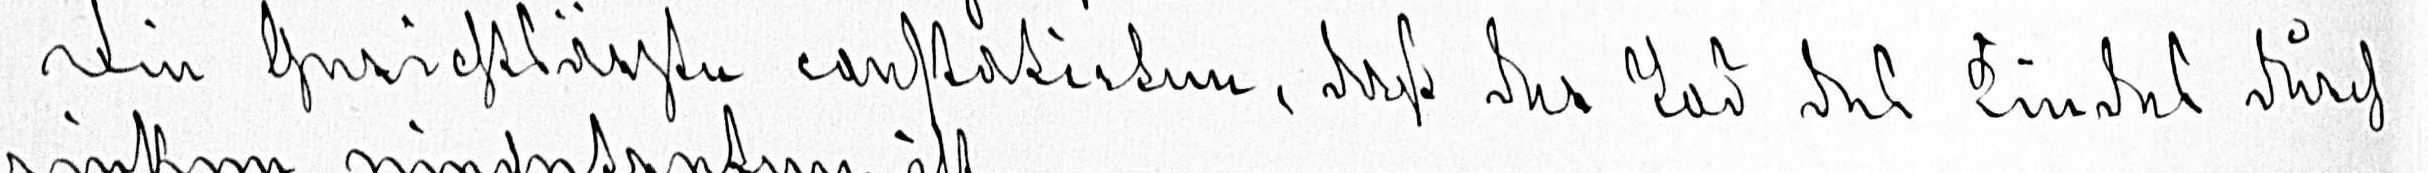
Die Gerichtsärzte constatirten, daß der Tod des Kindes durch
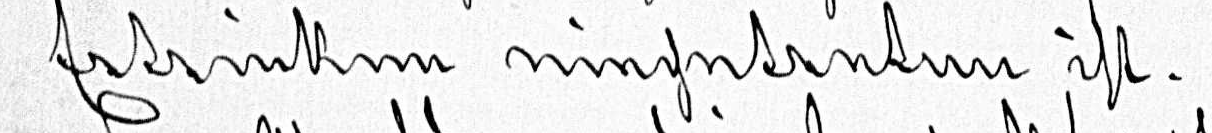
Ertrinken eingetreten ist.
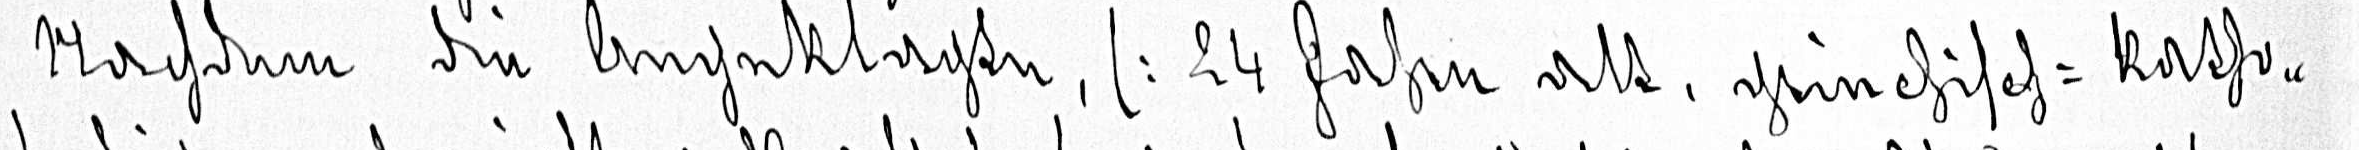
Nachdem die Angeklagten (24 Jahre alt, griechisch-katho¬
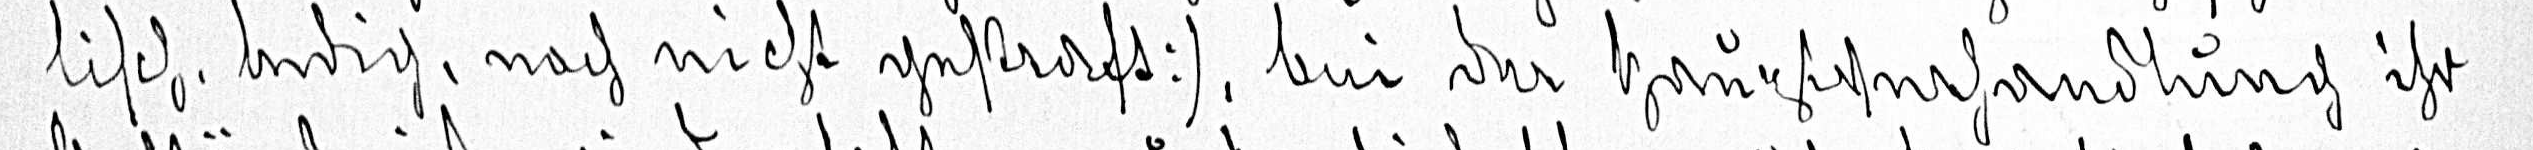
lisch, ledig, noch nicht gestraft) bei der Hauptverhandlung ihr
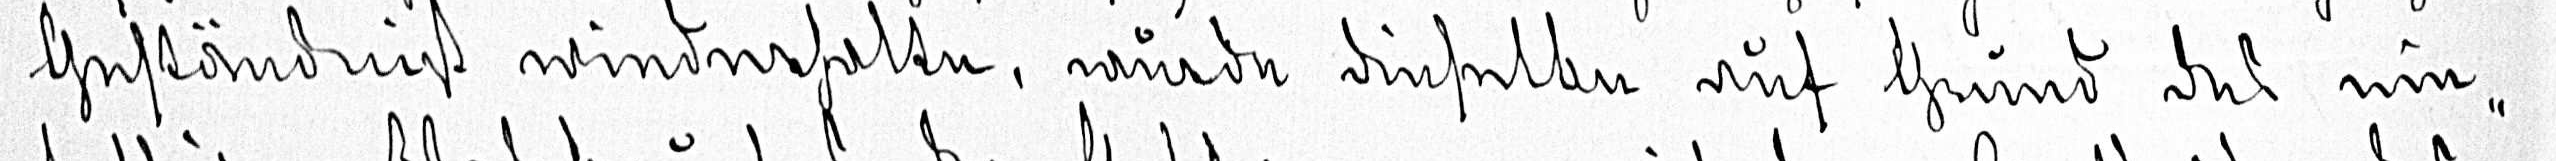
Geständniß wiederholte, wurde dieselbe auf Grund des ein¬
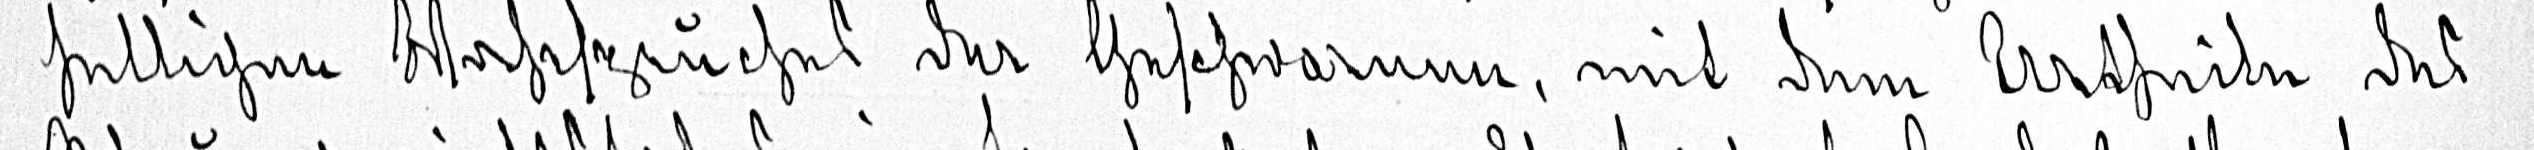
hellige Wahrspruches der Geschworene, mit dem Urtheile des
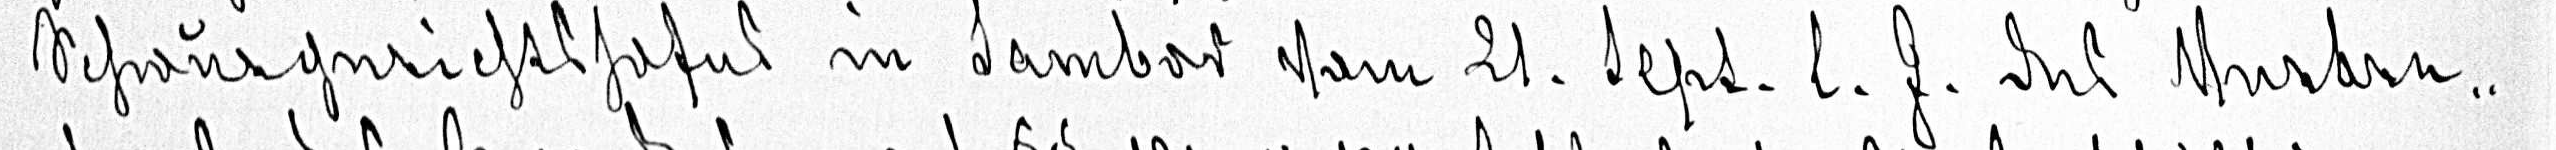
Schwurgerichtshofes in Sambor vom 21. Sept. l. J. des Verbre¬
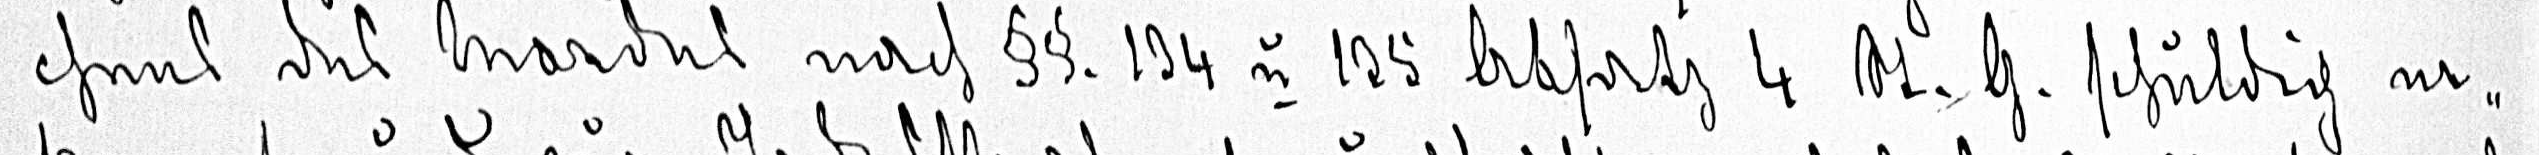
chens des Mordes nach §§ 134 u 135 Absatz 4 St. G. schuldig er¬
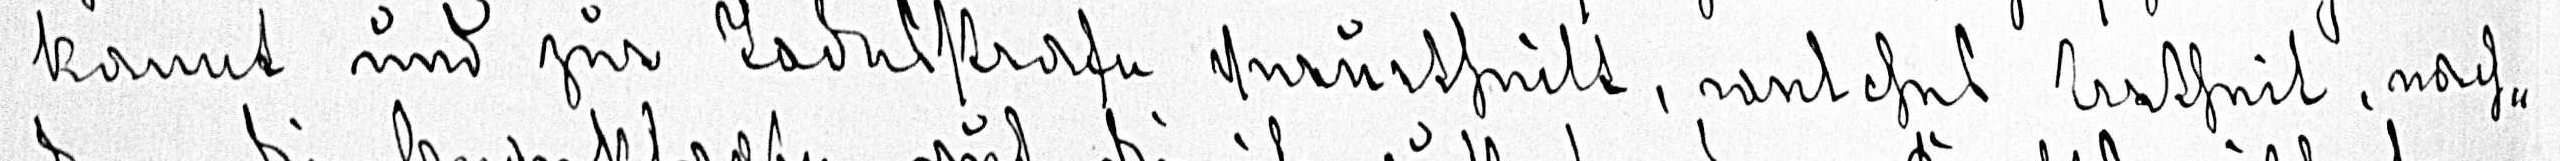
kannt und zur Todesstrafe verurtheilt, welches Urtheil nach¬
